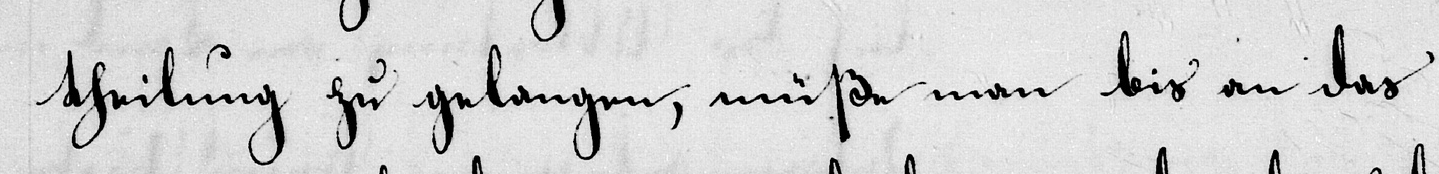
theilung zu gelangen, müße man bis an das
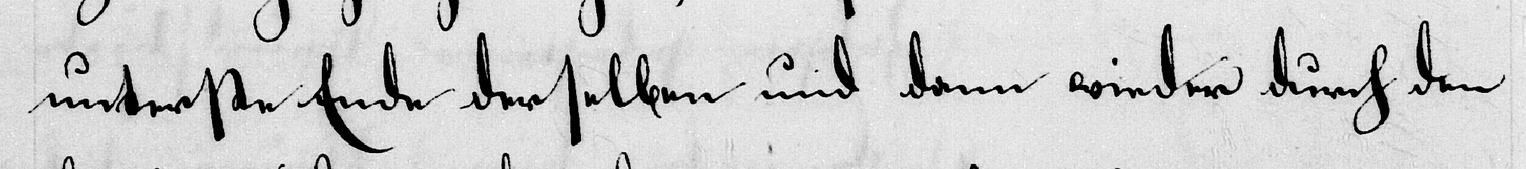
unterste Ende derselben und dann wieder durch den
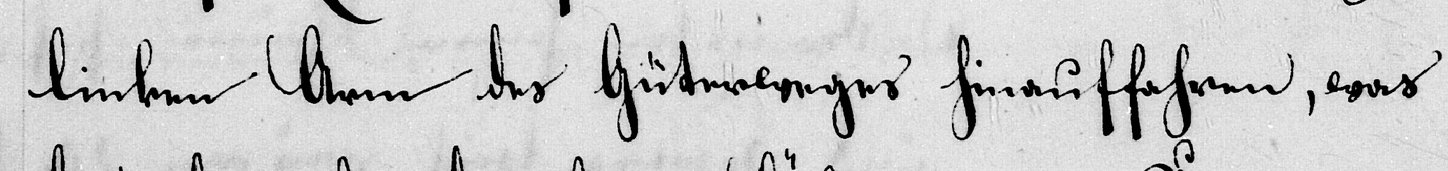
linken Arm des Güterweges hinauffahren, was
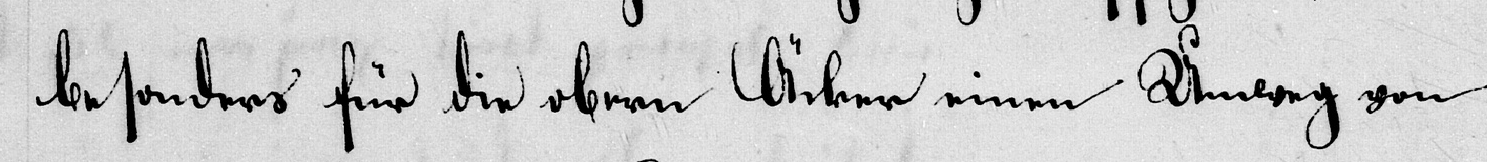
besonders für die obern Äcker einen Umweg von
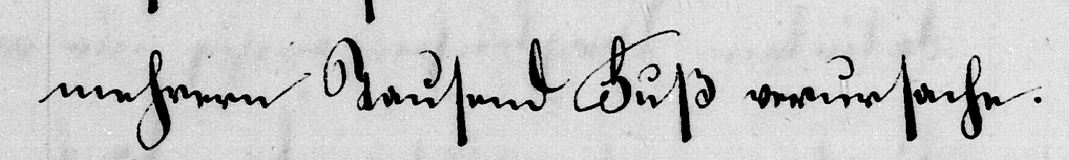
mehrern Tausend Fuß verursache.
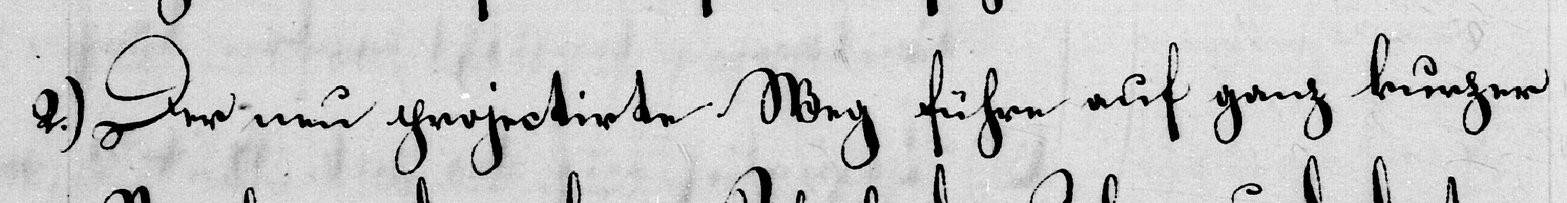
2.) Der nun projectirte Weg führe auf ganz kurzer
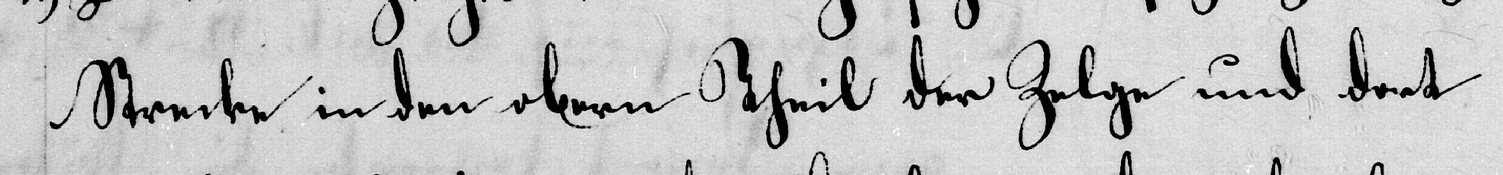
Strecke in den obern Theil der Zelge und dort
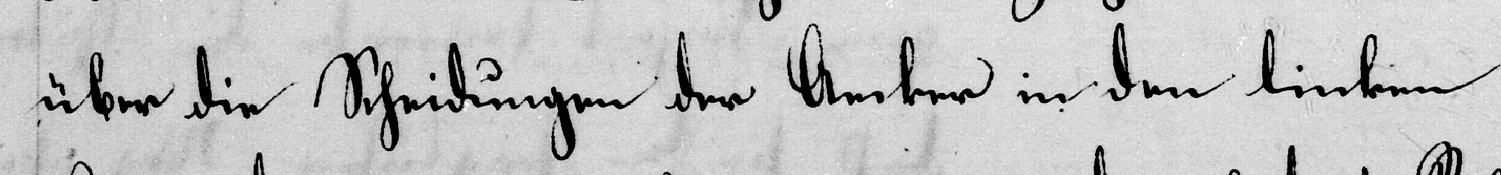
über die Scheidungen der Aecker in den linken
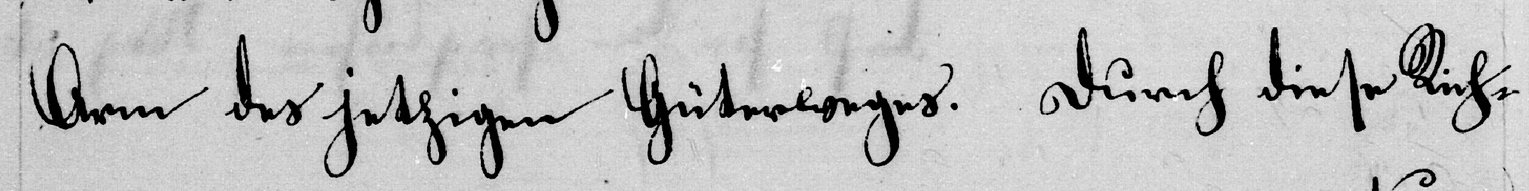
Arm des jetzigen Güterweges. Durch diese Rich-
